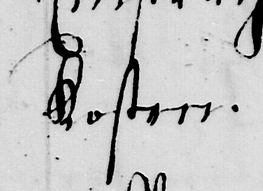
1sten
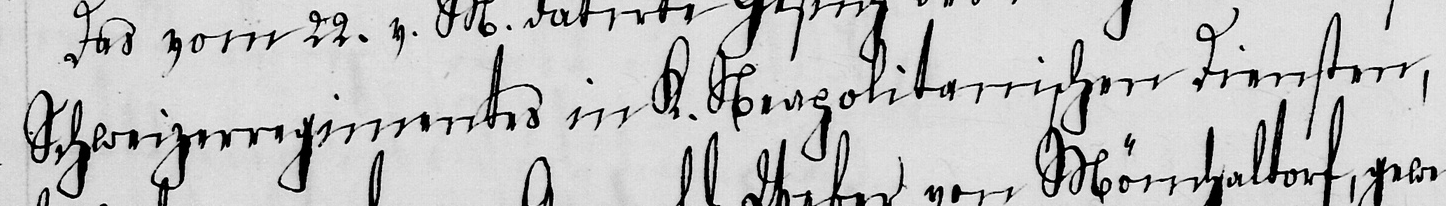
Schweizerregimentes in K. Neapolitanischen Diensten,
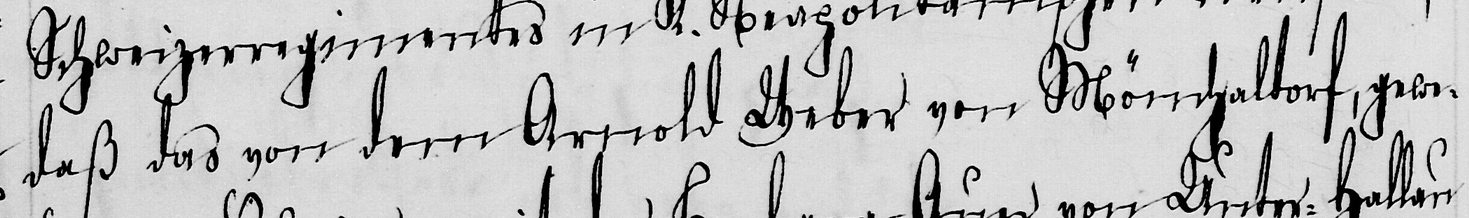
daß das von dem Arnold Weber von Mönchaltorf, gew¬
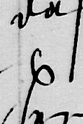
es¬
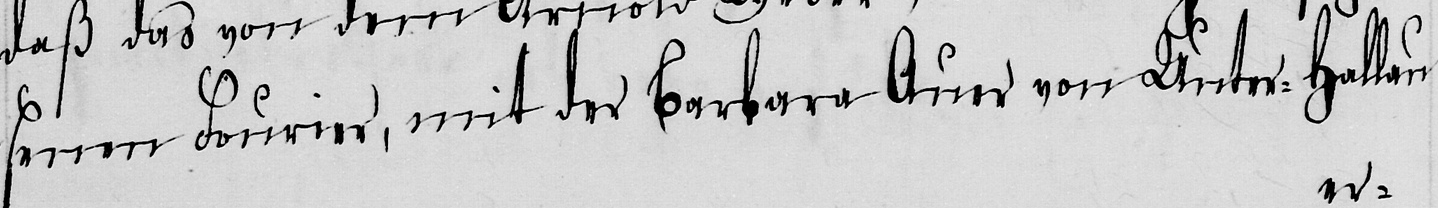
enen Fourier, mit der Barbara Auer von Unter-Hallau
